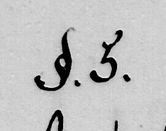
§. 5.
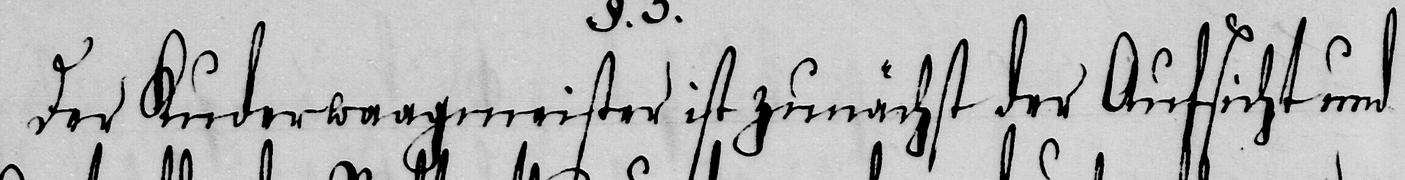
Der Kuderwaagmeister ist zunächst der Aufsicht und
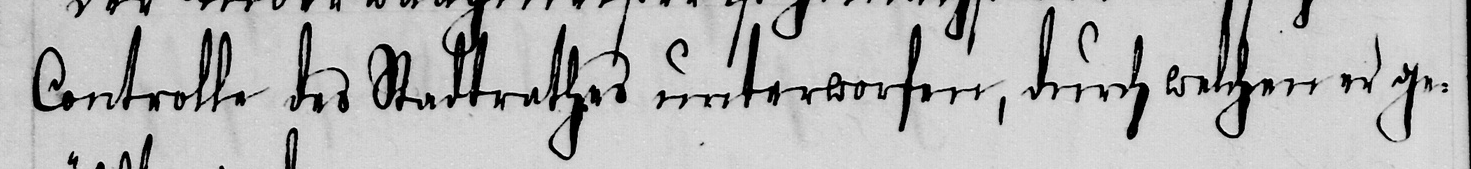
Controlle des Stadtrathes unterworfen, durch welchen er ge¬
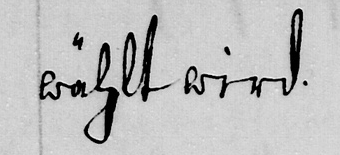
wählt wird.
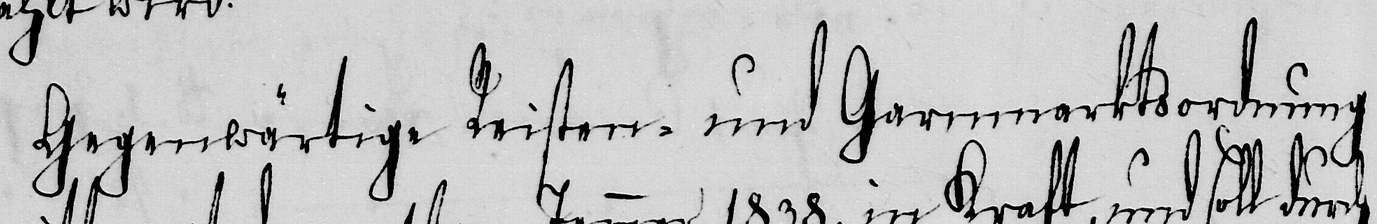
Gegenwärtige Reisten- und Garnmarktsordnung
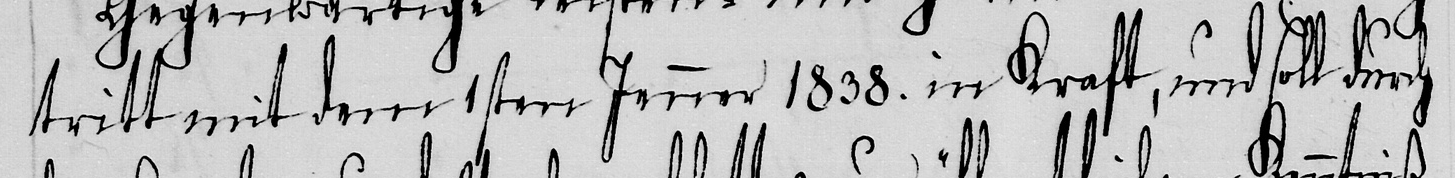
tritt mit dem 1sten Jenner 1838. in Kraft, und soll durch
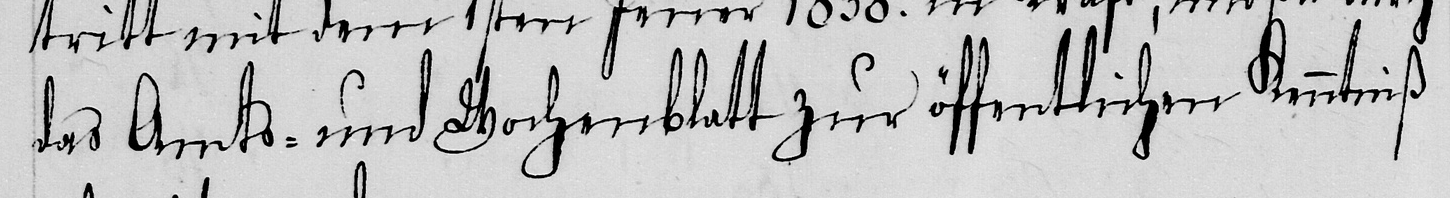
das Amts- und Wochenblatt zur öffentlichen Kenntniß
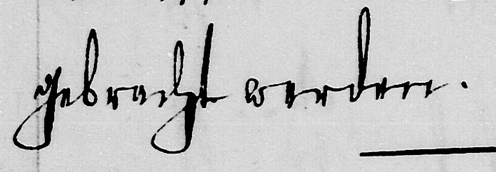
gebracht werden.
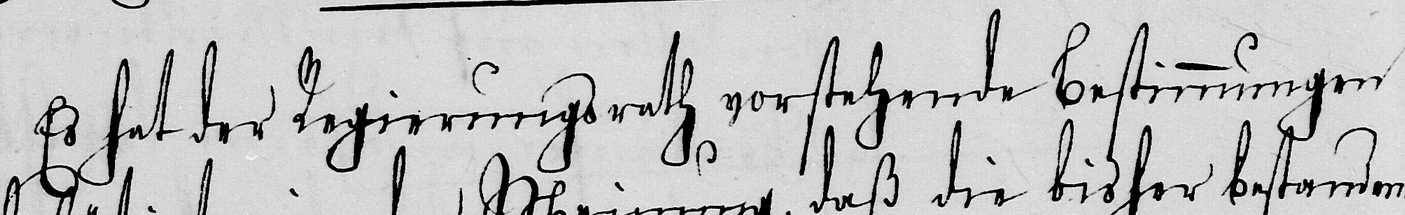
Es hat der Regierungsrath vorstehende Bestimmungen
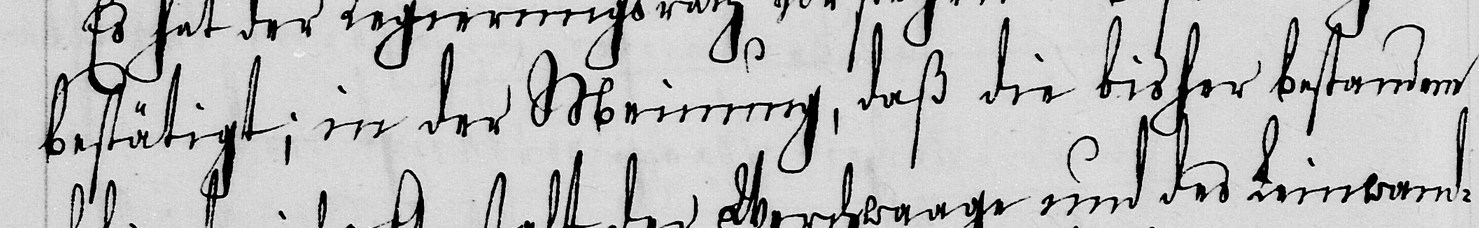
bestätigt; in der Meinung, daß die bisher bestandene
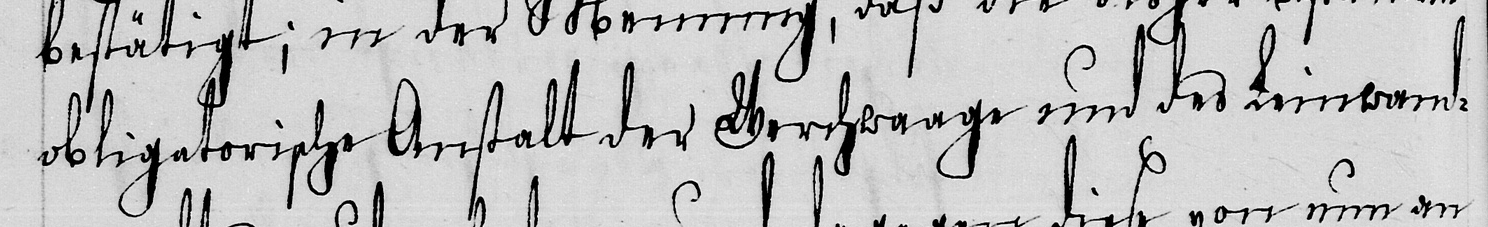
obligatorische Anstalt der Werchwaage und des Leinwand¬
